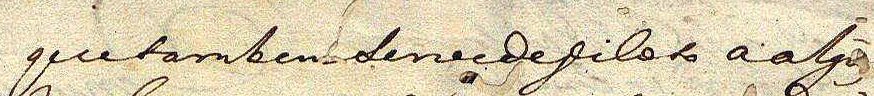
que tamben Serve de piloto a alg
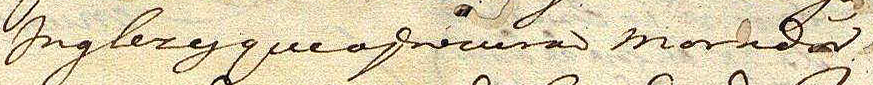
Jnglezes que o procuraõ morador,
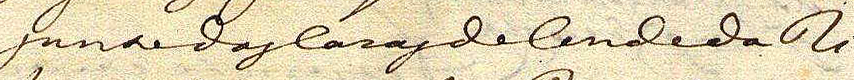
junto das Cazas de Conde da Ri
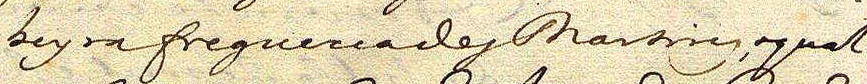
beyra freguezia dos Martires, o qual
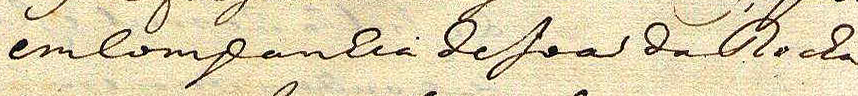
em companhia de Joaõ da Rocha
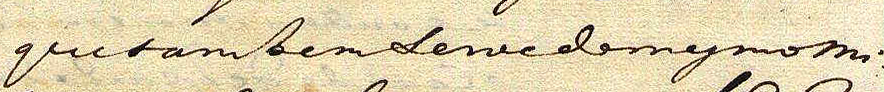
que tambem Serve do mesmo mi
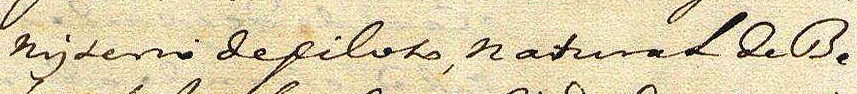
nisterio de piloto, natural de Be
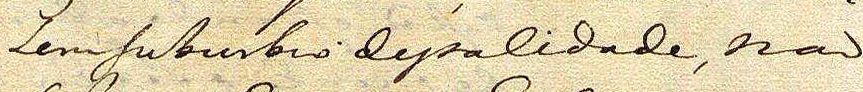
Lem suburbio desta Cidade, naõ
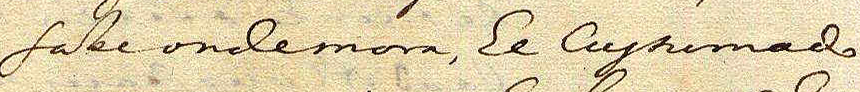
sabe onde mora, he Custumado
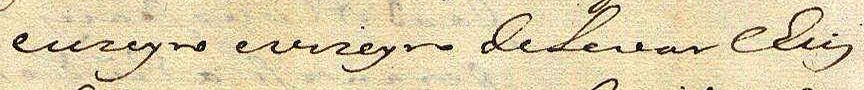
e uzeyro e vizeyro de levar Chris
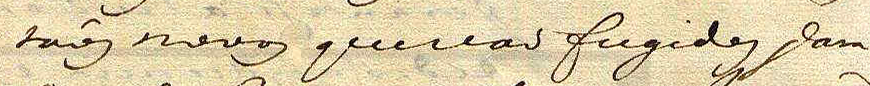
taõs novos que vaõ fugidos para
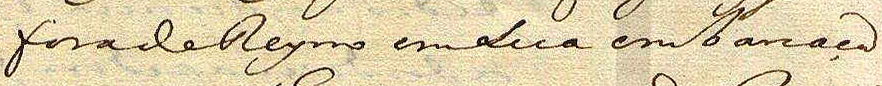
fora do Reyno em sua embarcaçaõ
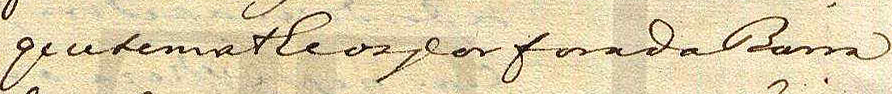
que tem athe oz por fora da Barra
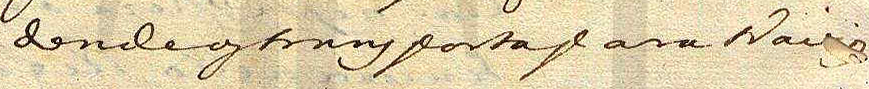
donde os transporta para Navios
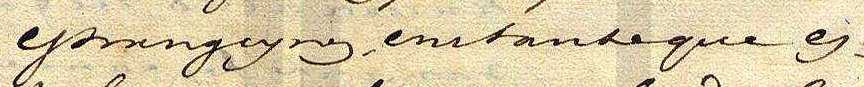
estrangeyros, emtanto que es
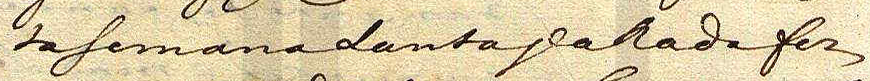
ta semana santa passada fez
